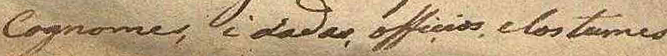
Cognomes, idades, officios e Costumes
